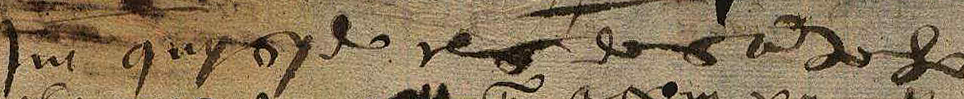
Jmquysydores do sāto ho
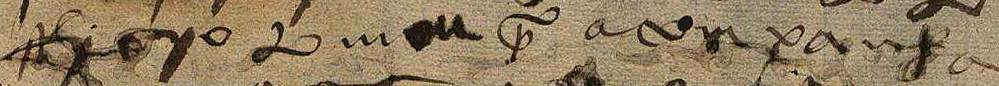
fycyo tomou p̄o a companha
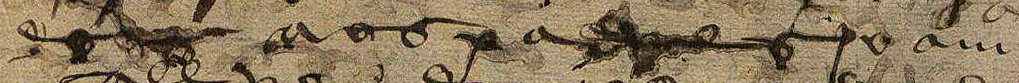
dores aos padres joam
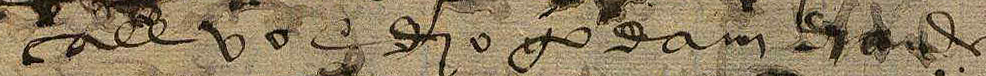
callvo djogo damdrade
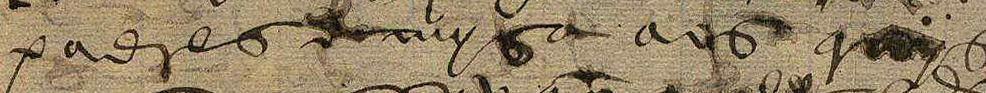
padres de mysa aos quays
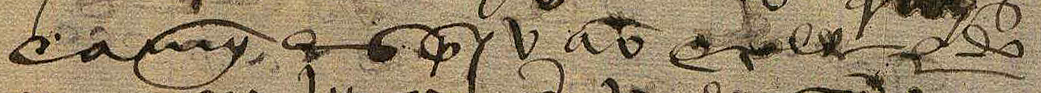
e a mȳ Esp̄yvaõ e ele Ldo
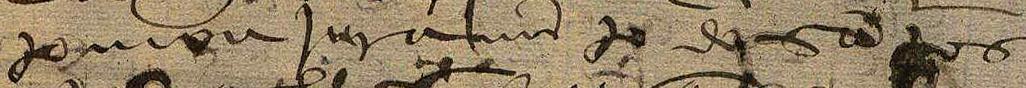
tomou Juramēto do sātos
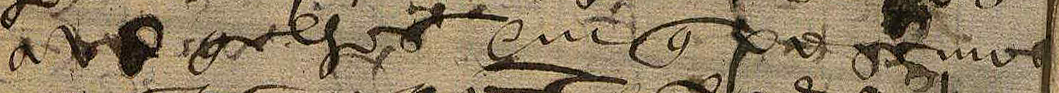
avāgelhos em q̄ posemos
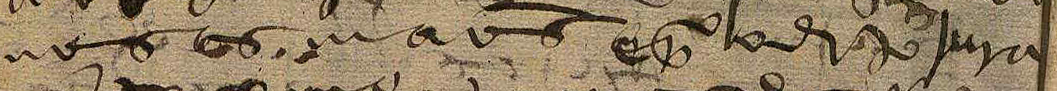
nosas maõs e p̄o o djto Jura
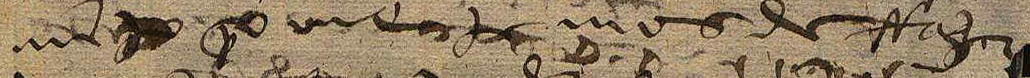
mēto p̄ometemos de ffazer
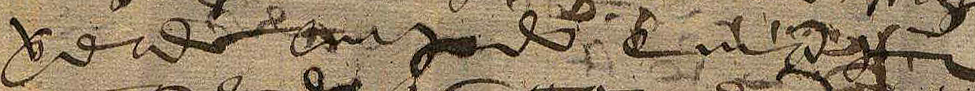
ꝟdade em todo e māter
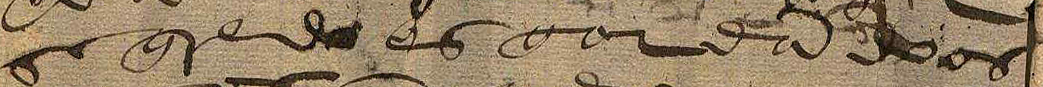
segredo esgardādo os
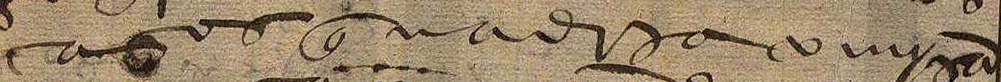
casos q̄ na djta comysā
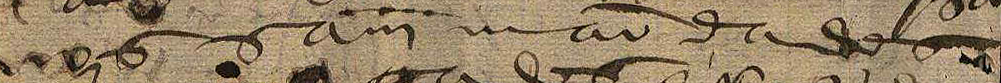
nos sam mãodados
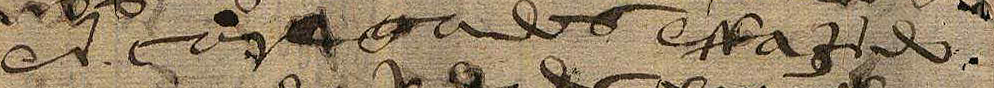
e ēcaregados e ffazēdo.
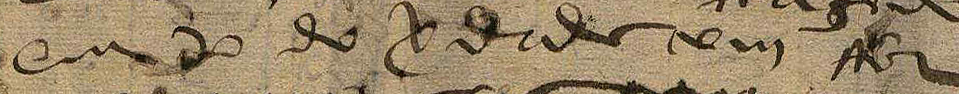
em todo ꝟdade comffor
